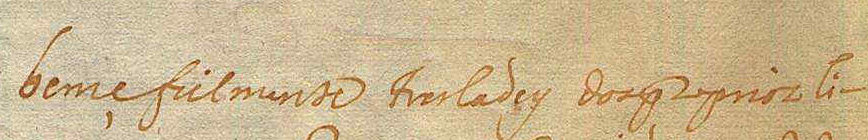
bem e fielmente tresladey dos proprios li
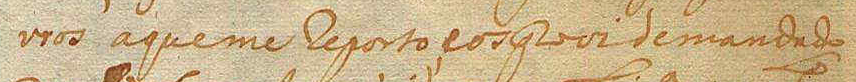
vros a que me Reporto, e os provi de mandado
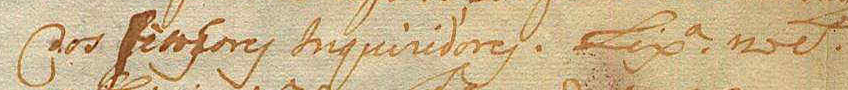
dos Senhores Inquizidores. Lix.a no s.to
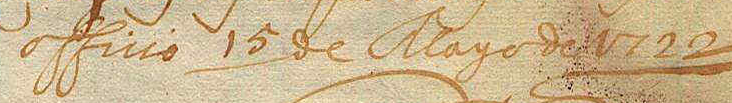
officio 15 de Mayo de 1722
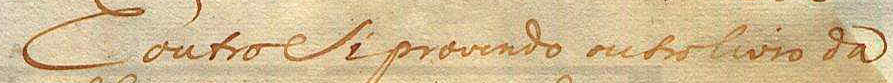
E outrosi provendo outro livro da
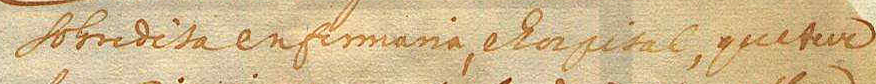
sobredita enfermaria, e hospital, que teve
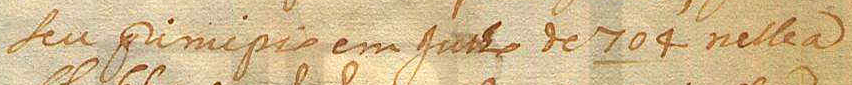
seu principio em Julho de 704 nelle a
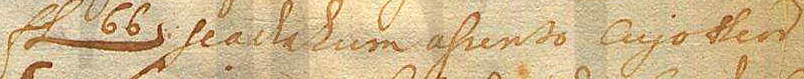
fL 66. se acha hum assento cujo theor
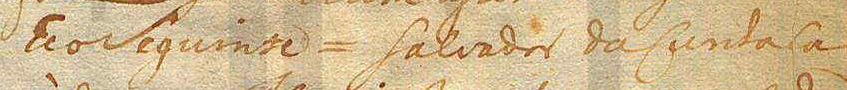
he o Seguinte = Salvador da Cunha ca
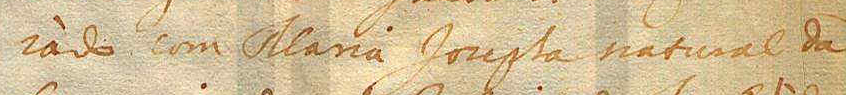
zado com Maria Jozepha natural da
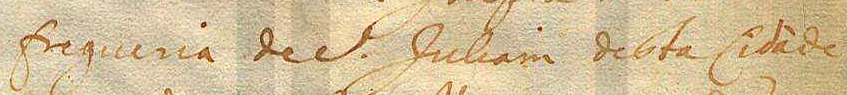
freguezia de S. Juliam desta Cidade
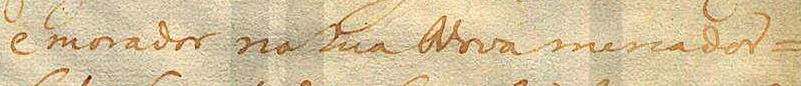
e morador na Rua Nova mercador
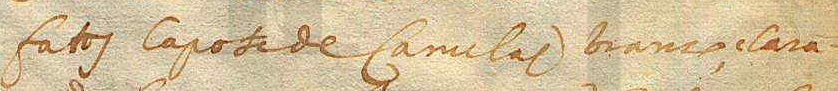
fatos Capote de Camelaꝭ branco, e caza
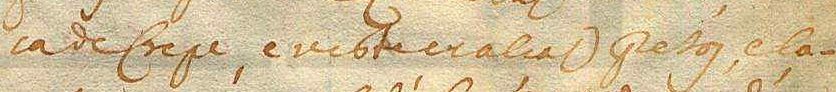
ca de Crepe, e veste e calçaꝭ pretos, e ça
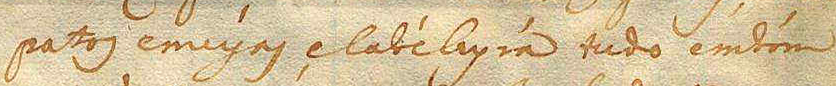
patos e meyas, e cabeCeyra tudo em bom
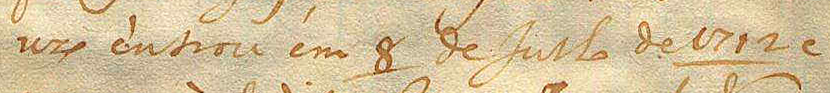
uzo entrou em 8 de Julho de 1712 e
